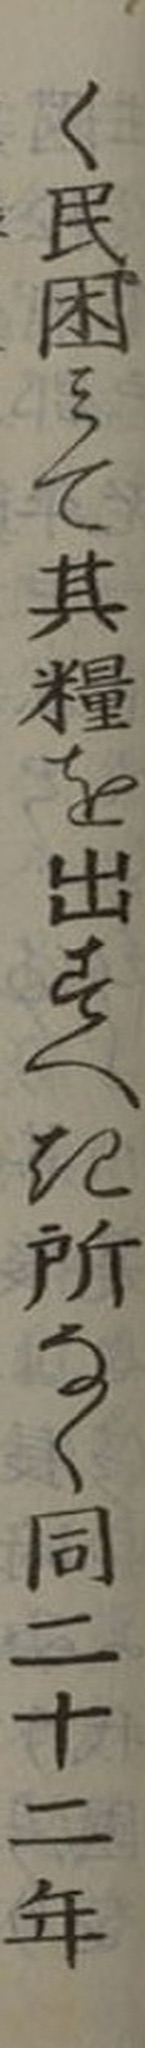く民困みて其糧を出すへき所なく同二十二年
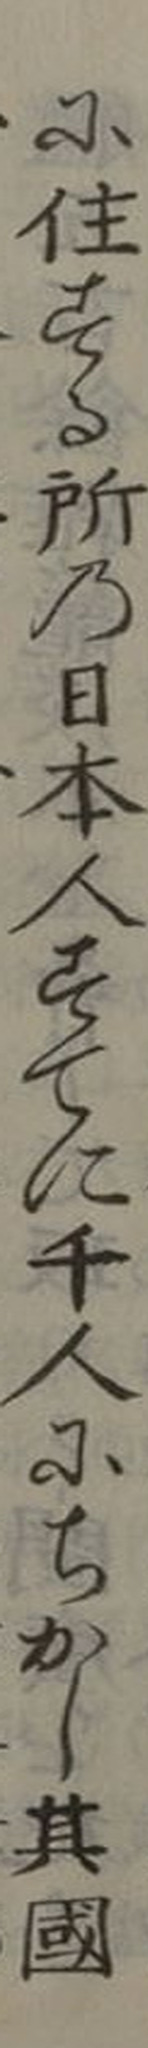に住する所の日本人すてに千人にちかし其國
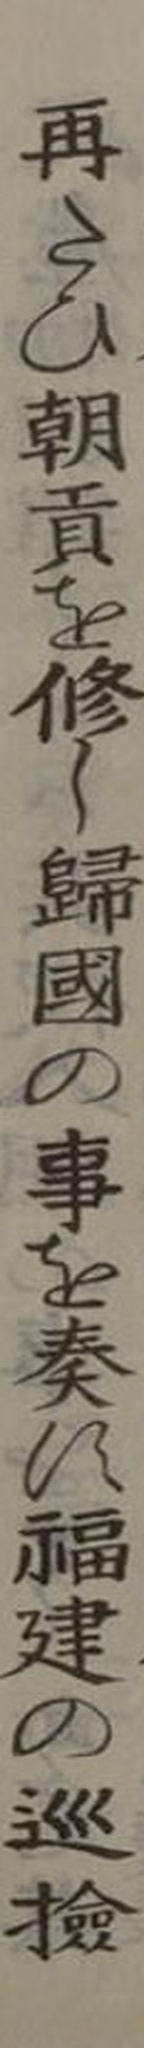再たひ朝貢を修し歸國の事を奏す福建の巡撿
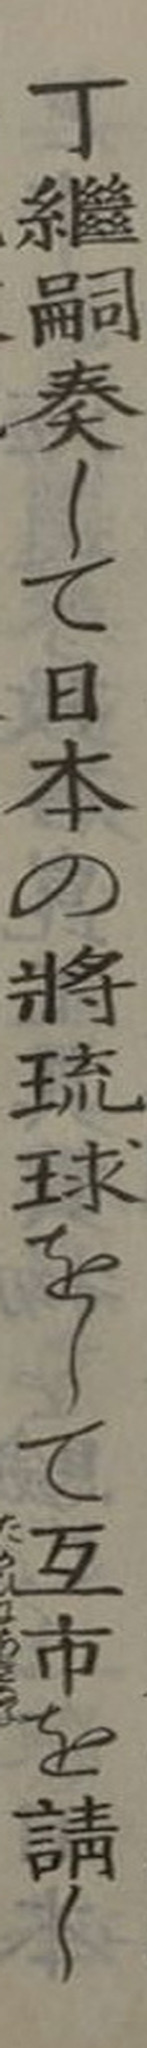丁繼嗣奏して日本の將琉球をして互市を請し
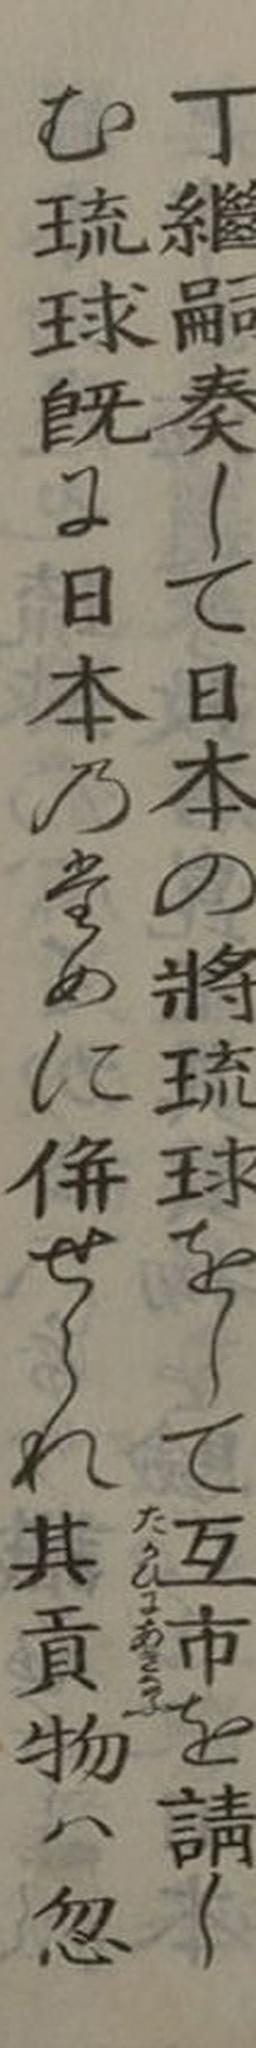む琉球既に日本のために併せられ其貢物は忽

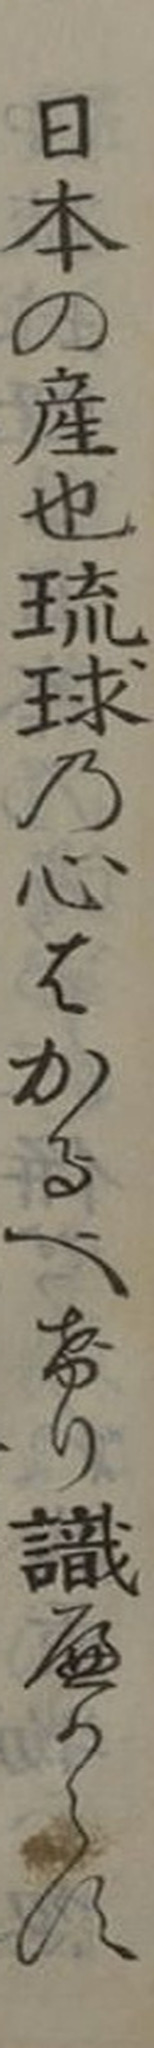日本の産也琉球の心はかるへけり識へからす
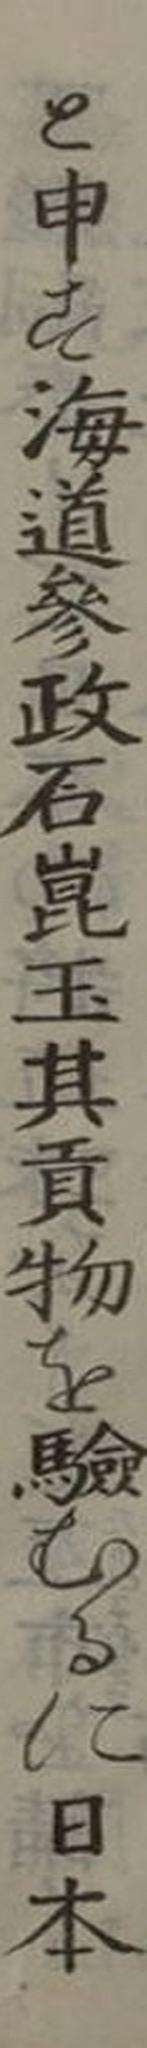と申す海道參政石崑玉其貢物を驗むるに日本
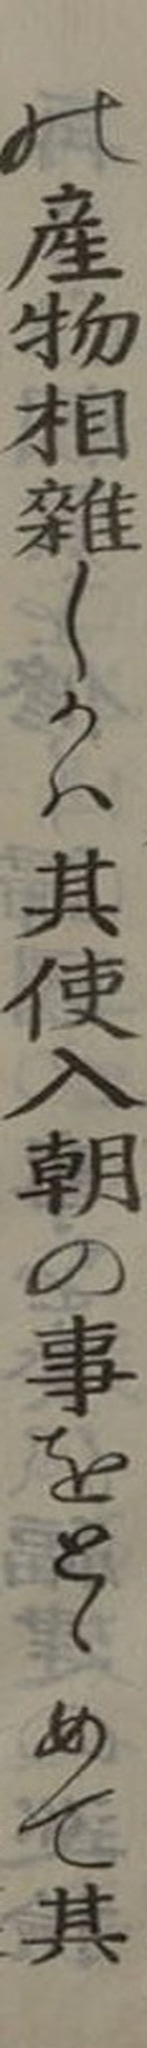の産物相雜しかは其使入朝の事をとゝめて其
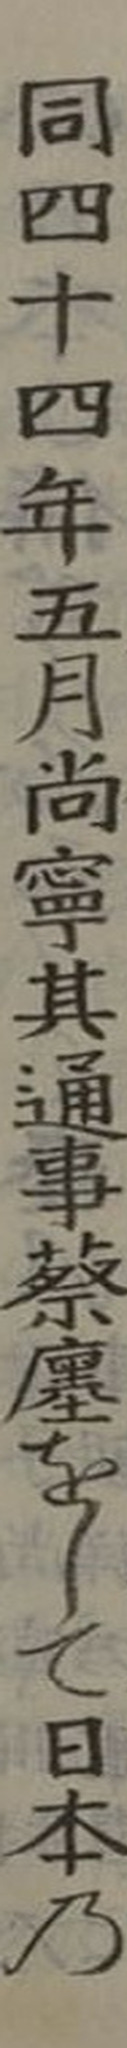同四十四年五月尚寧其通事蔡廛をして日本の
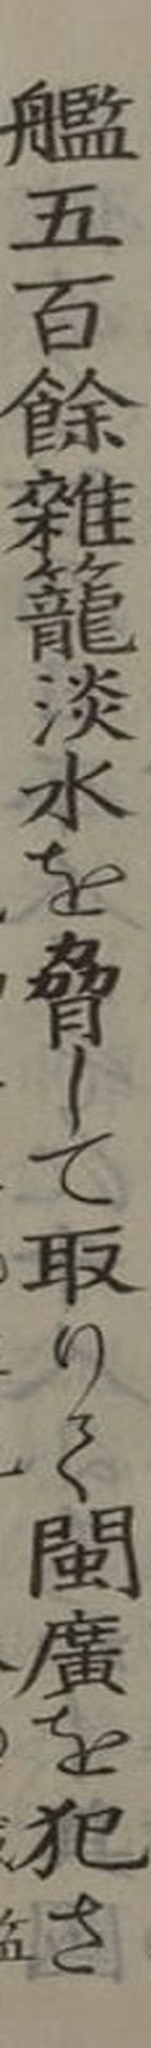艦五百餘雜籠淡水を脅して取りて閩廣を犯さ
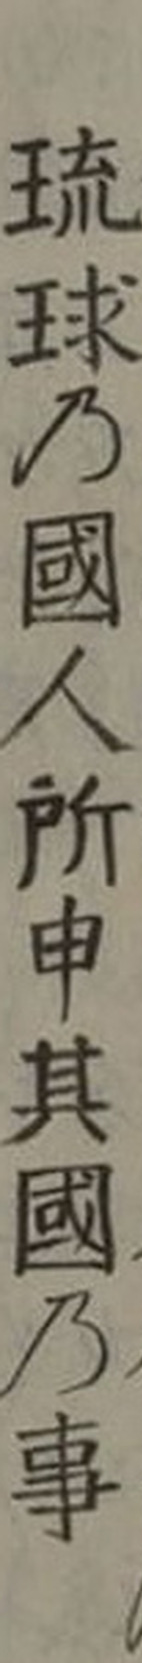琉球の國人所申其國の事
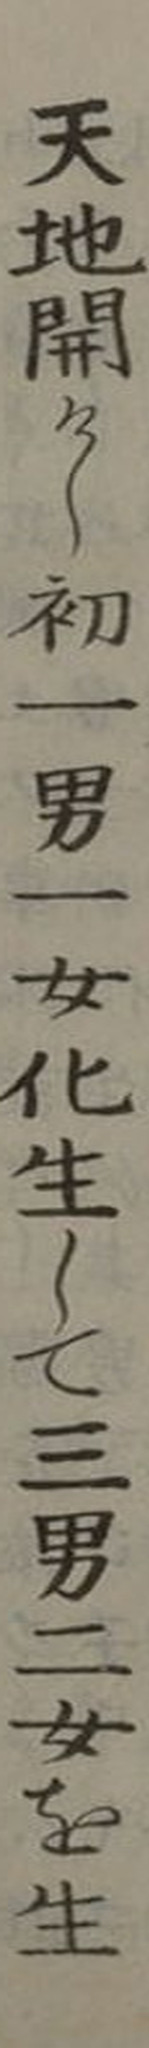天地開けし初一男一女化生して三男二女を生
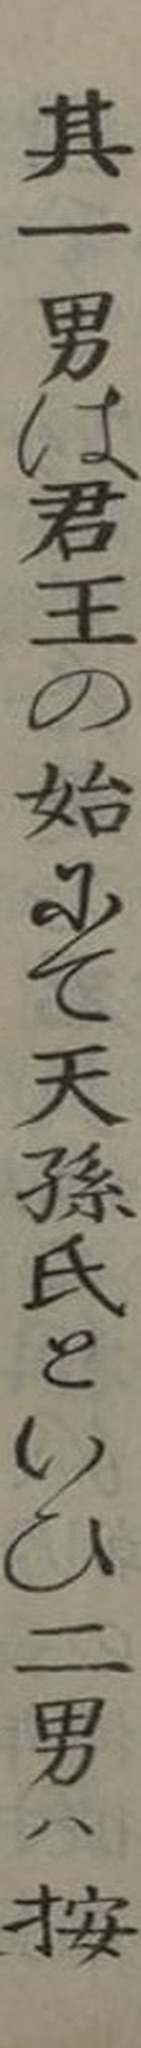其一男は君王の始にて天孫氏といひ二男は按
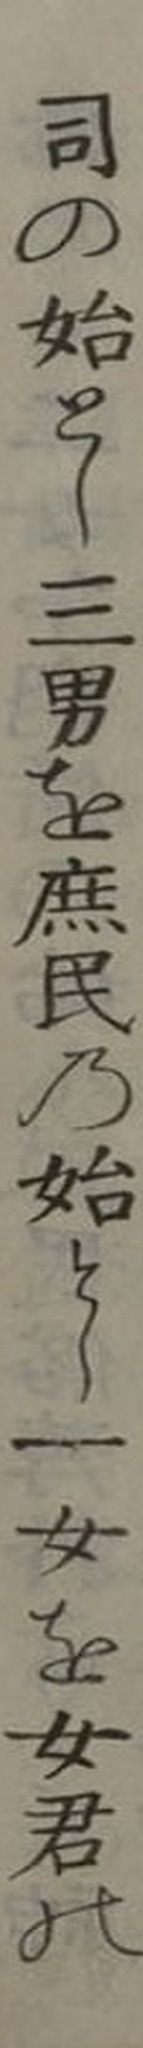司の始とし三男を庶民の始とし一女を女君の

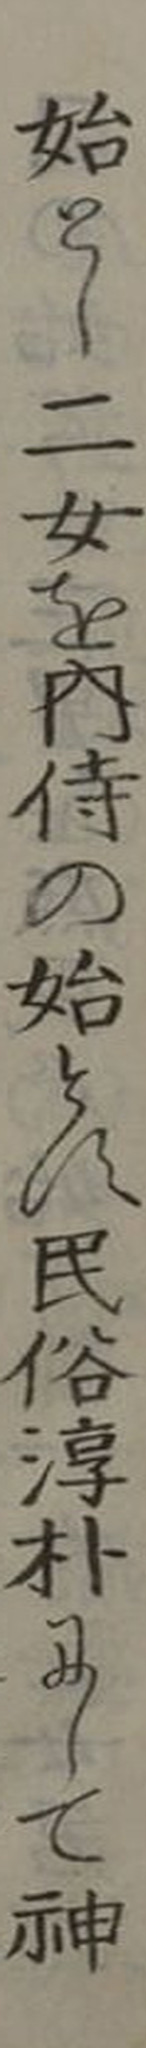始とし二女を内侍の始とす民俗淳朴にして神
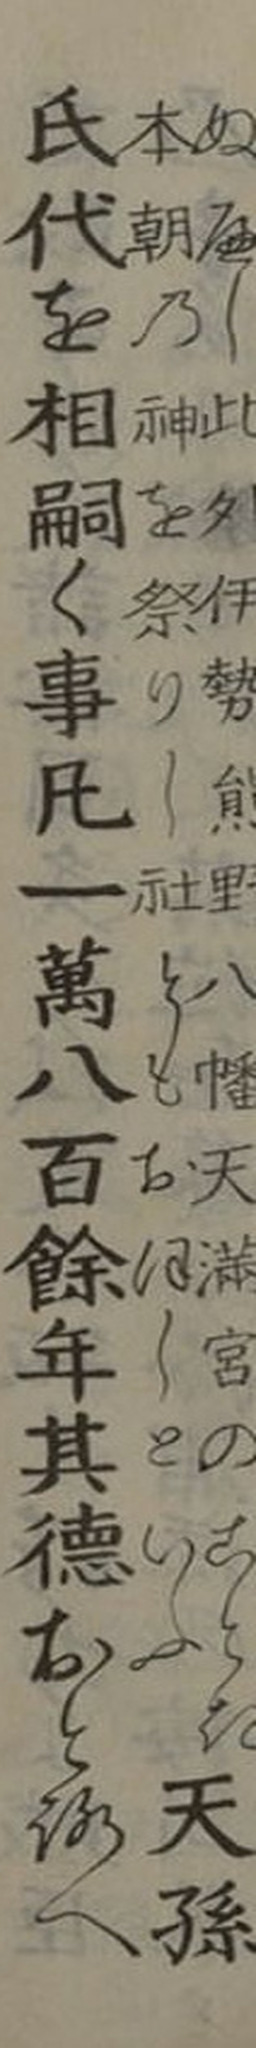氏代を相嗣く事とも一萬八百餘年其德おとろへ
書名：骨董録
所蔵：University of the Ryukyus Library
